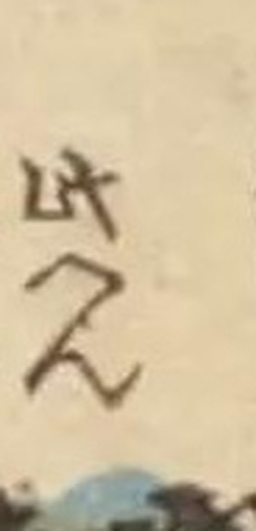此へん
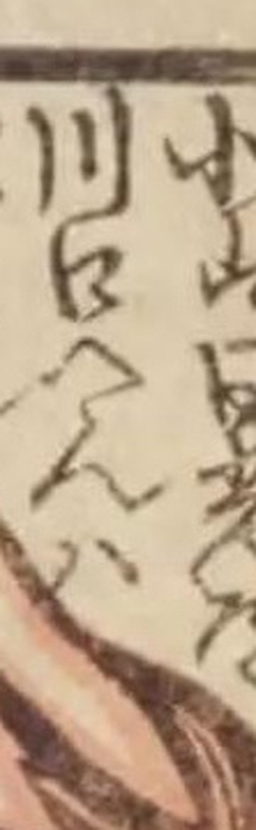川口へんは
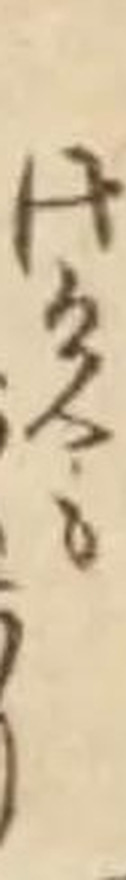けか人も
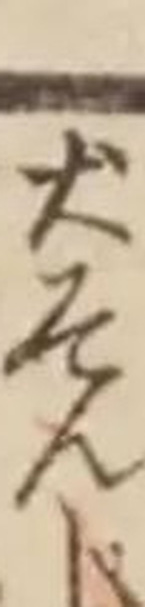大そん
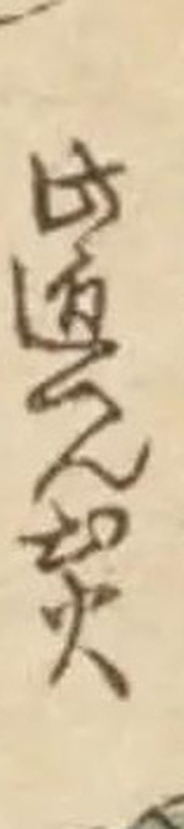此近へん出火
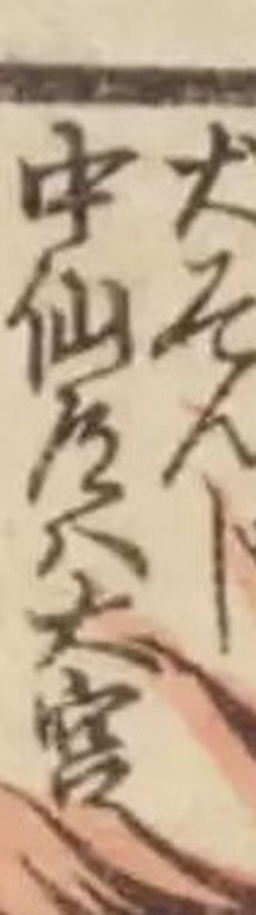中仙道は大宮
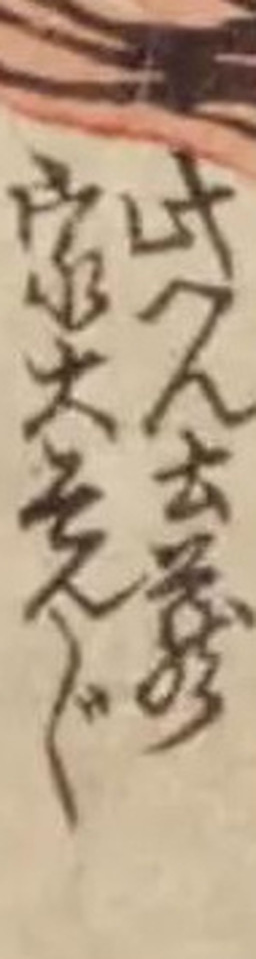家大そんじ
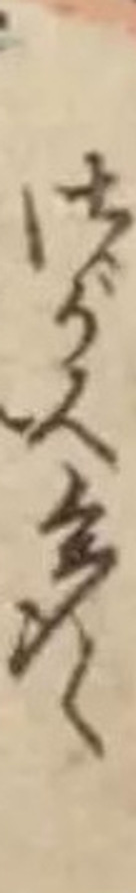けが人多く
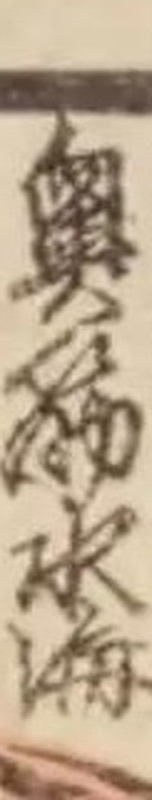奥筋水海
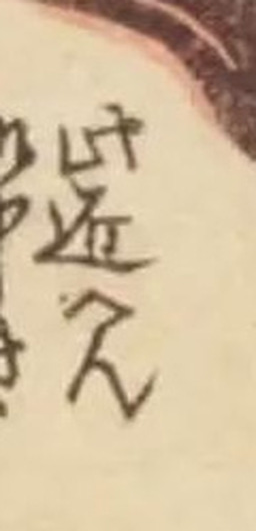此辺へん
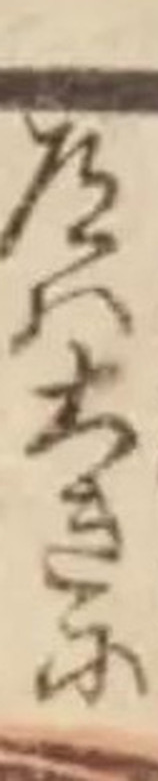道は大きに
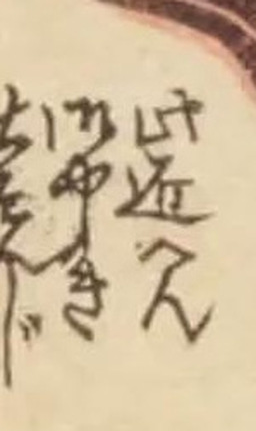御やしき
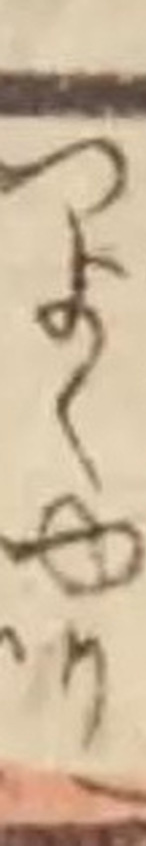つよくゆり
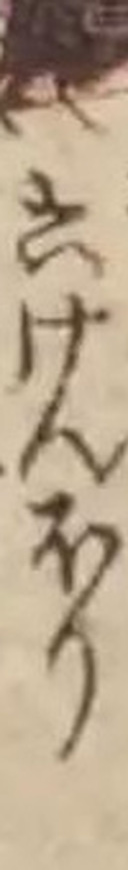六けんほり
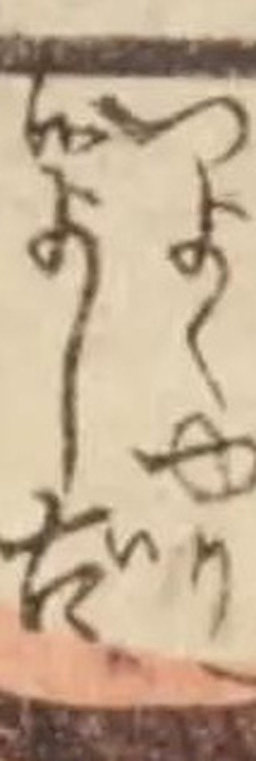候よし古
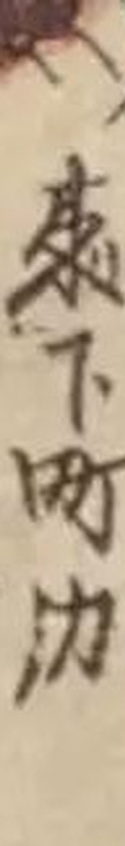森下町内
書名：銘細改板江戸大地震出火場所附
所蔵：国立国会図書館 National Diet Library, JAPAN
